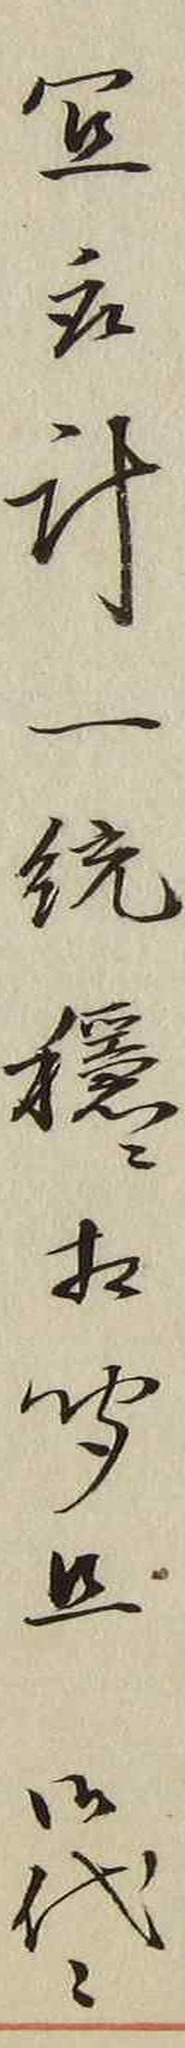宜取計一統穏ニ相聞且御代々
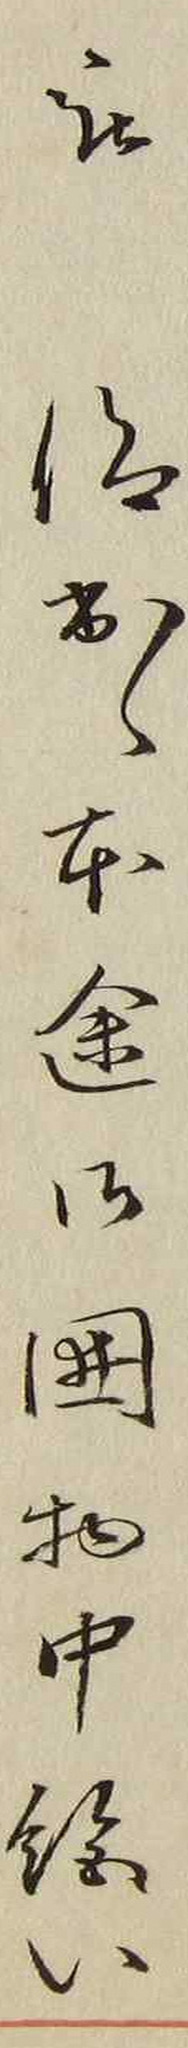被仰出候本途御囲物中絶い
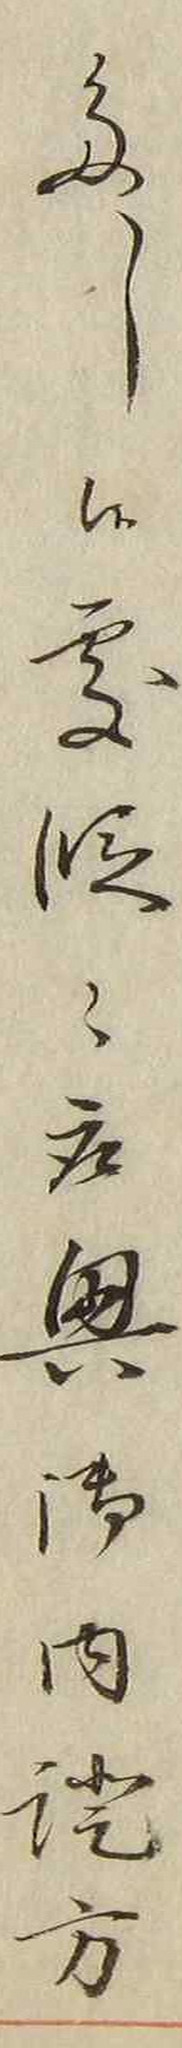たし候処段々取興御内証方

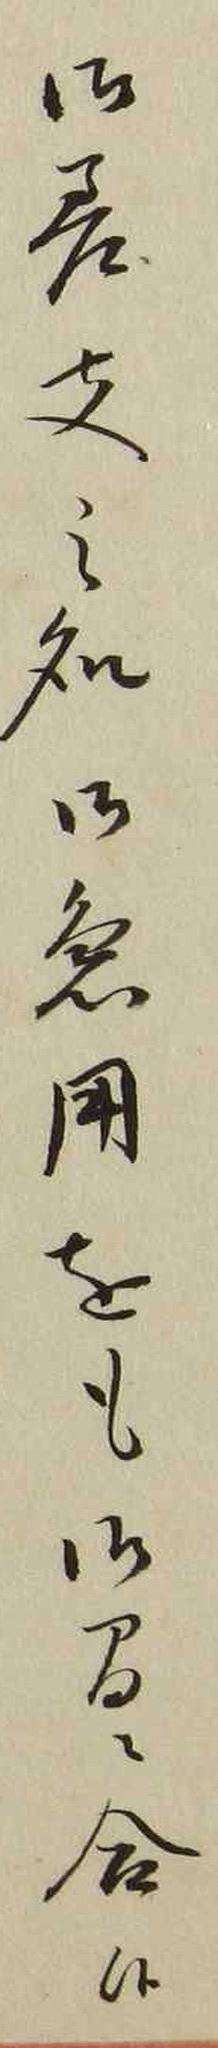御差支之処御急用をも御間ニ合候
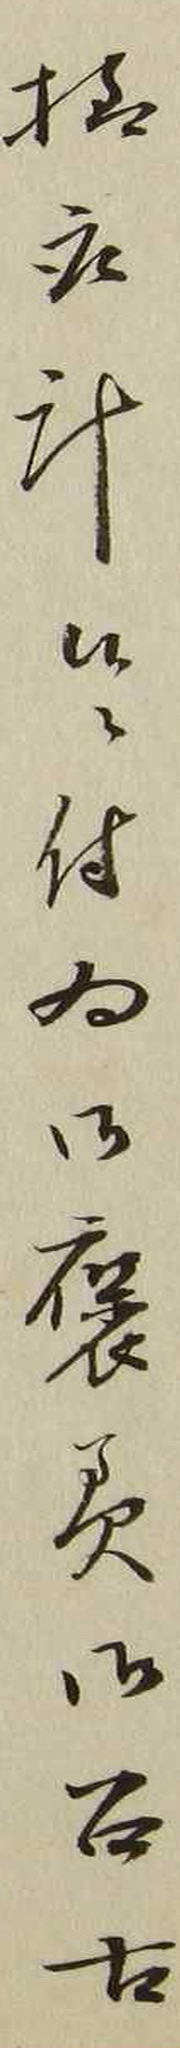様取計候ニ付為御褒美御召古
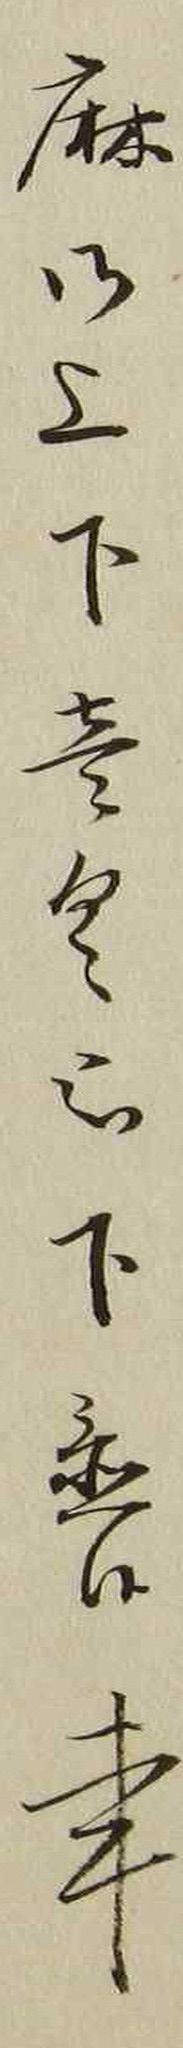麻御上下壱具被下置候事
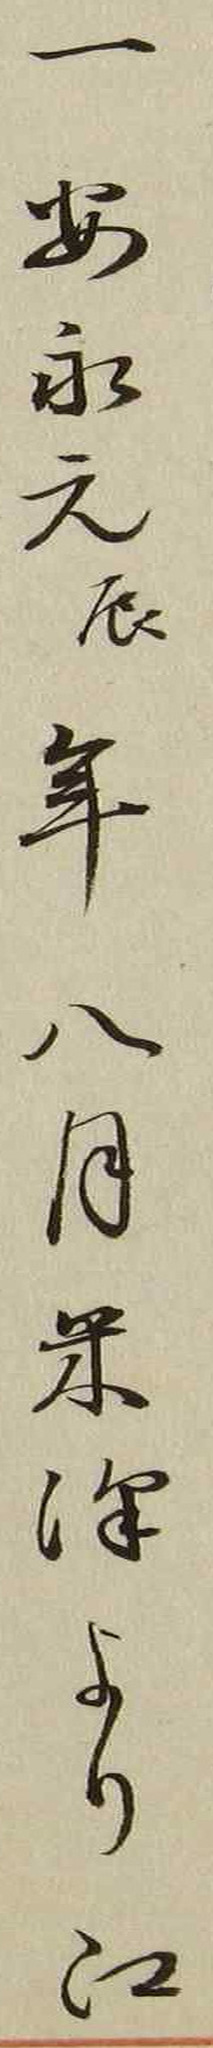一安永元辰年八月米沢より江
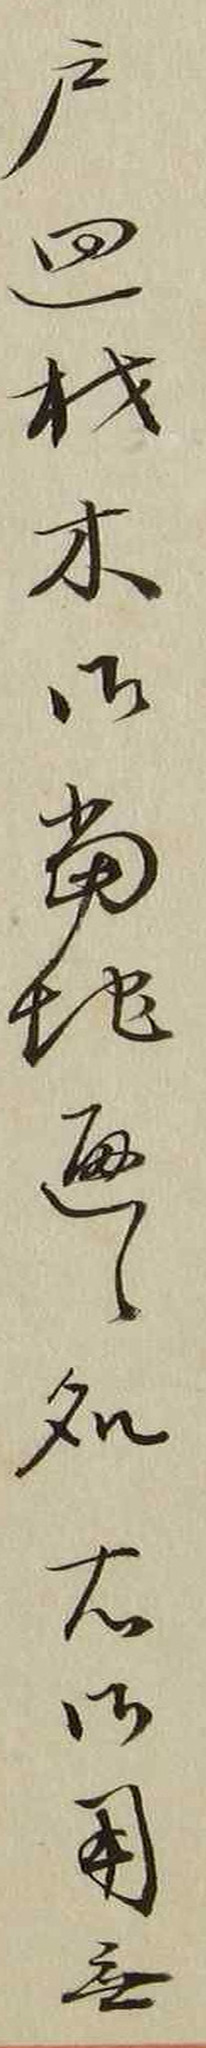戸廻材木御当地通候処右御用無
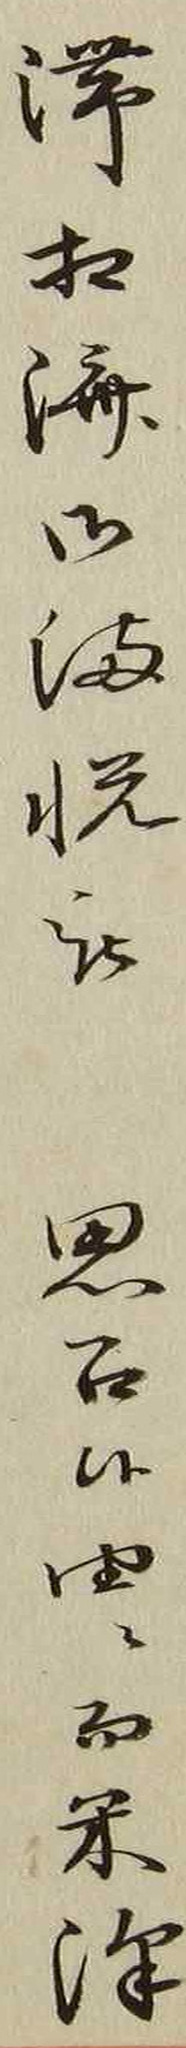滞相済御満悦被思召候由ニ而米沢
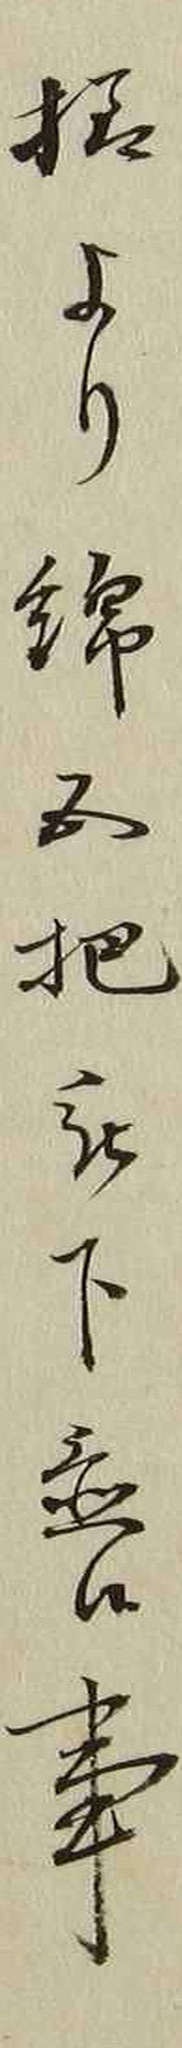様より綿五把被下置候事
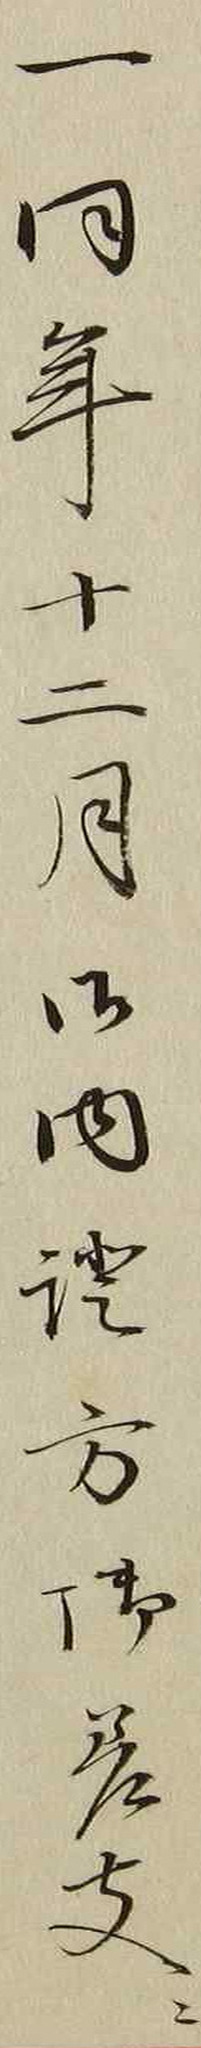一同年十二月御内証方御差支ニ
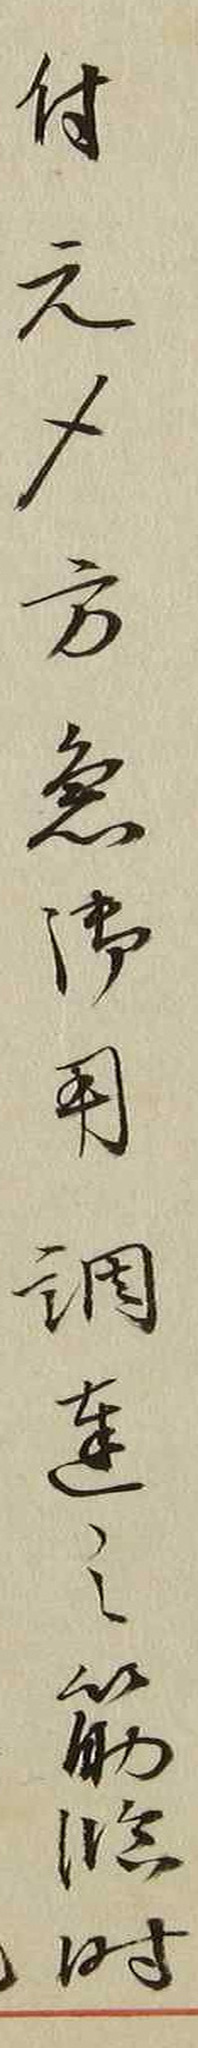付元〆方急御用調達之筋臨時
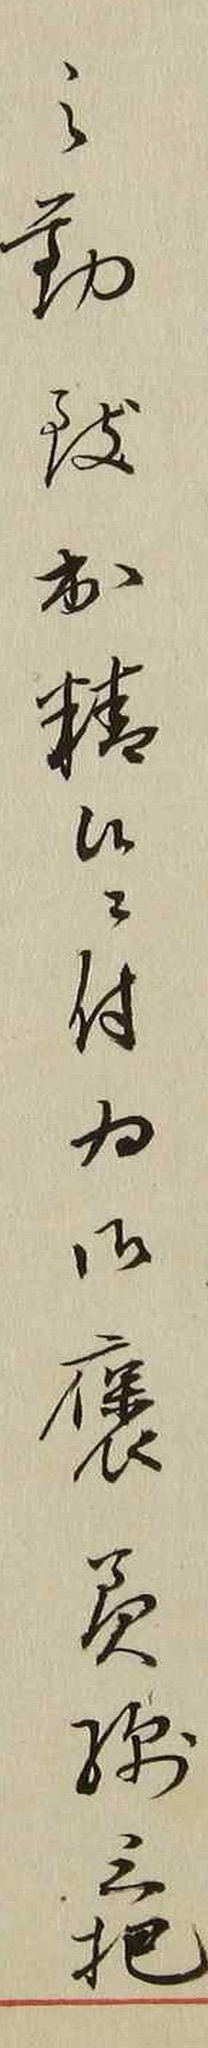之勤致出精候ニ付為御褒美綿三把
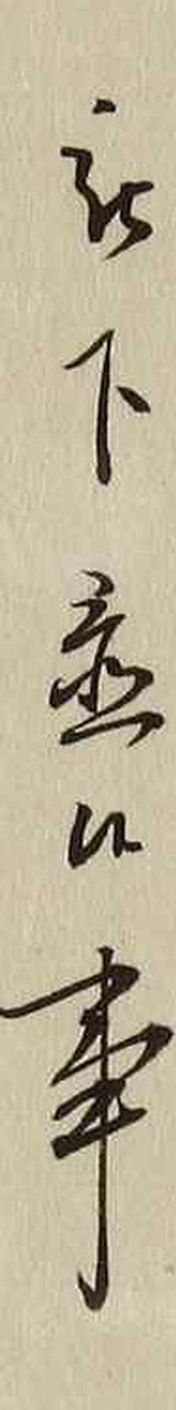被下置候事
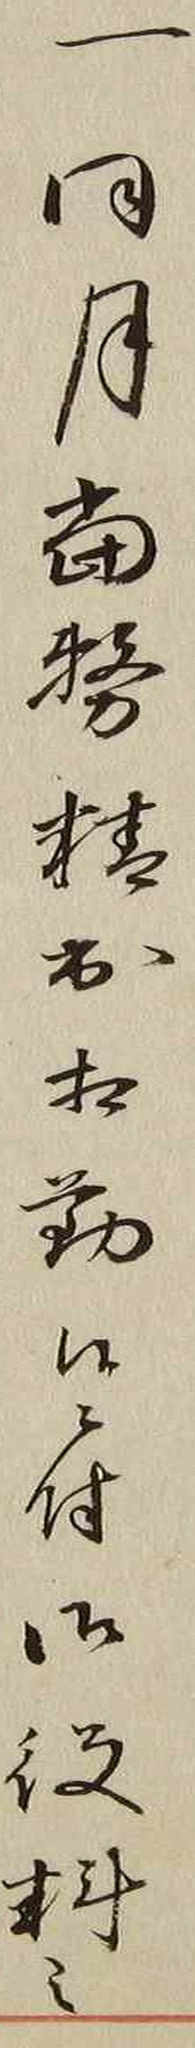一同月当務精出相勤候ニ付御役料之
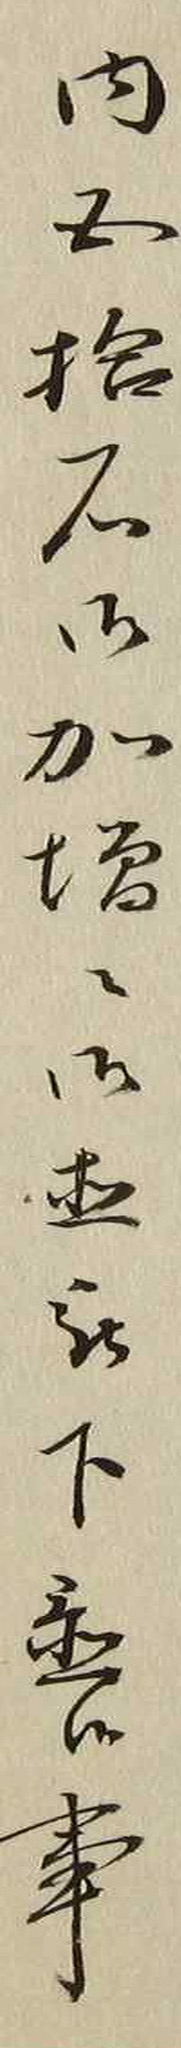内五拾石御加増ニ御直被下置候事
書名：諸士系譜　巻之22　い之部22
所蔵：会津若松市立会津図書館
